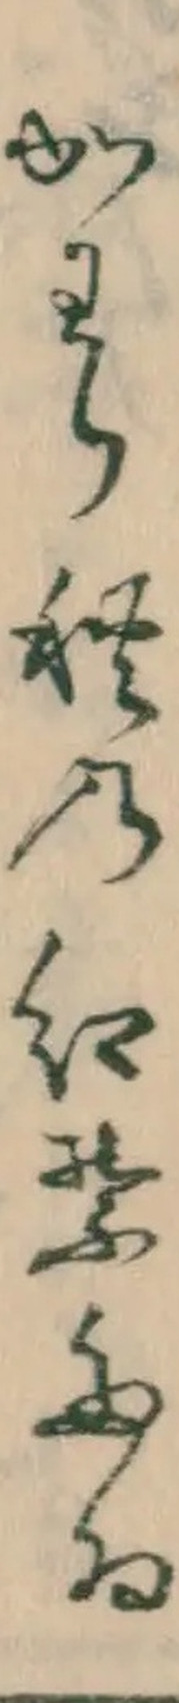かわり秋の紅葉たゐ
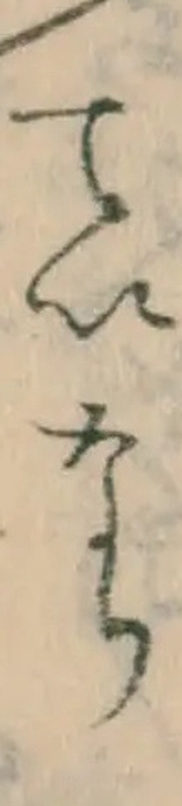ていなり
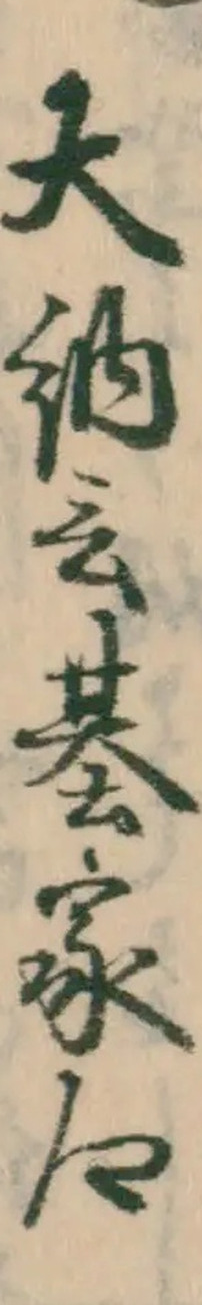大納言基家卿
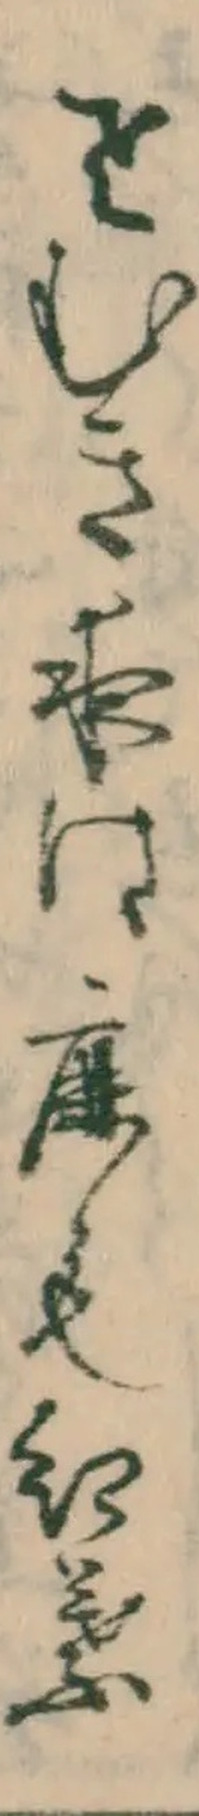さむき夜は鹿も紅葉
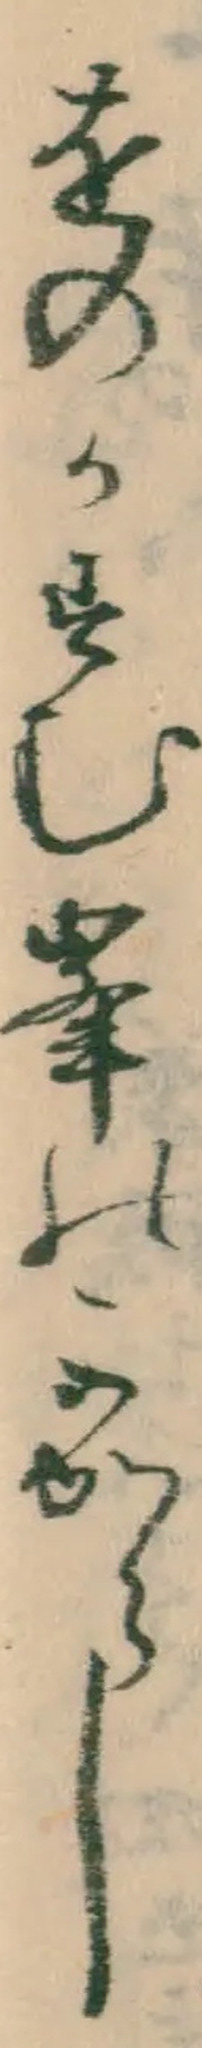をのかすむ峯のこからし
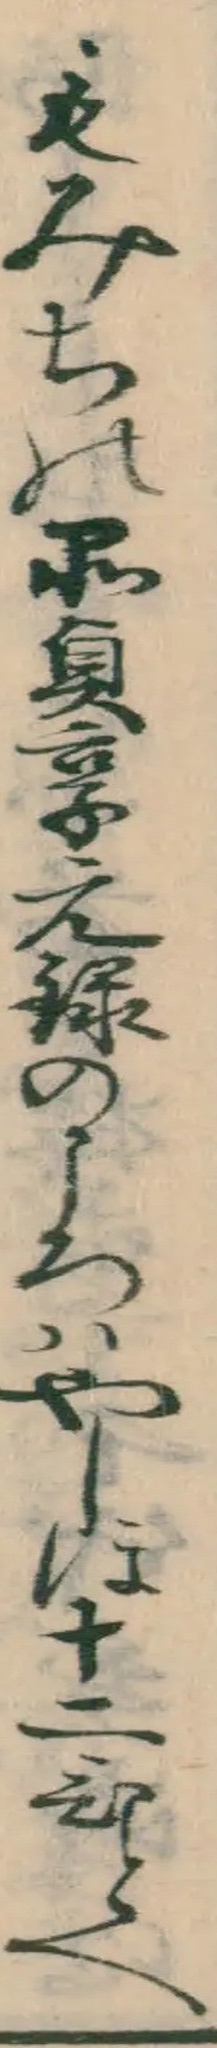もみちの品貞享元禄のころはやしほ十二ひとへ
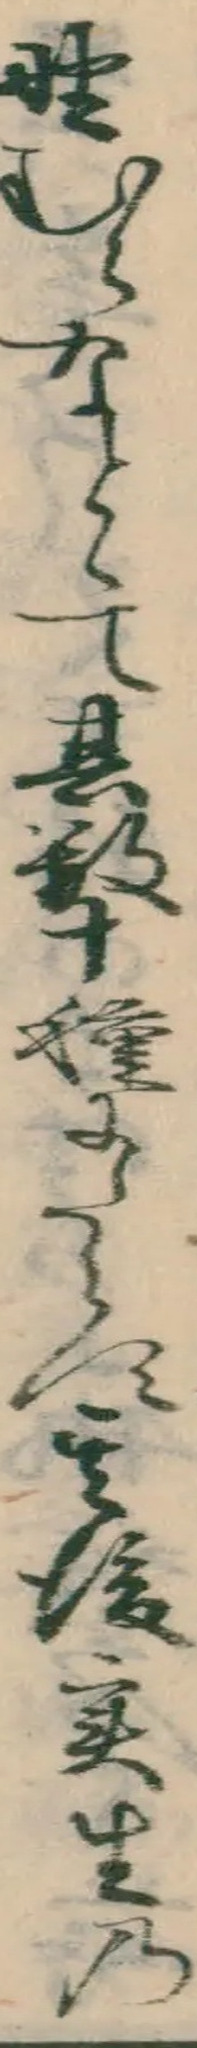野むらなとゝて其数十種にたらす其後実生の
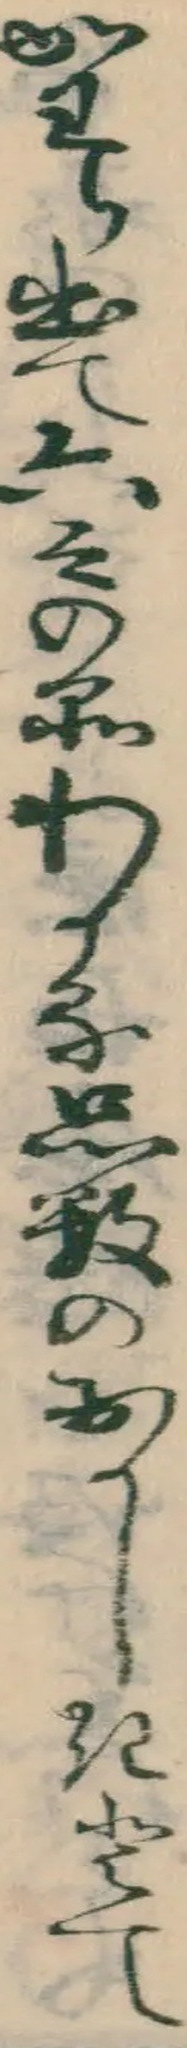かわり出て六々の品わかる品数のおかしきとて
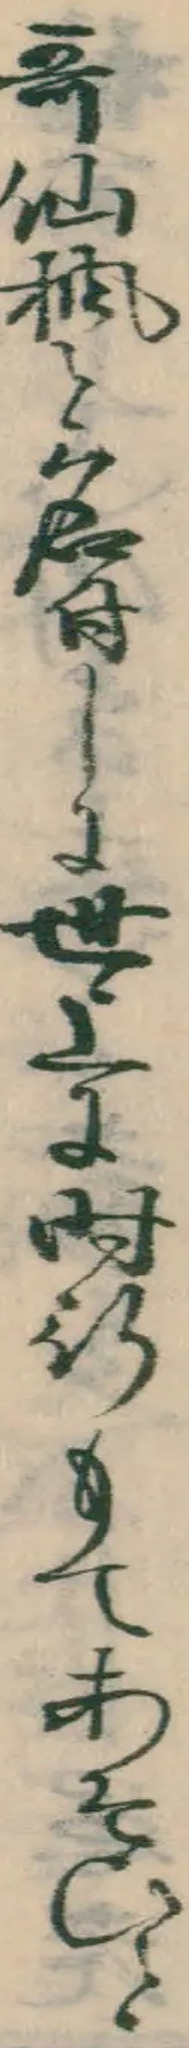哥仙楓と名付しに世上に時行もてあそひと
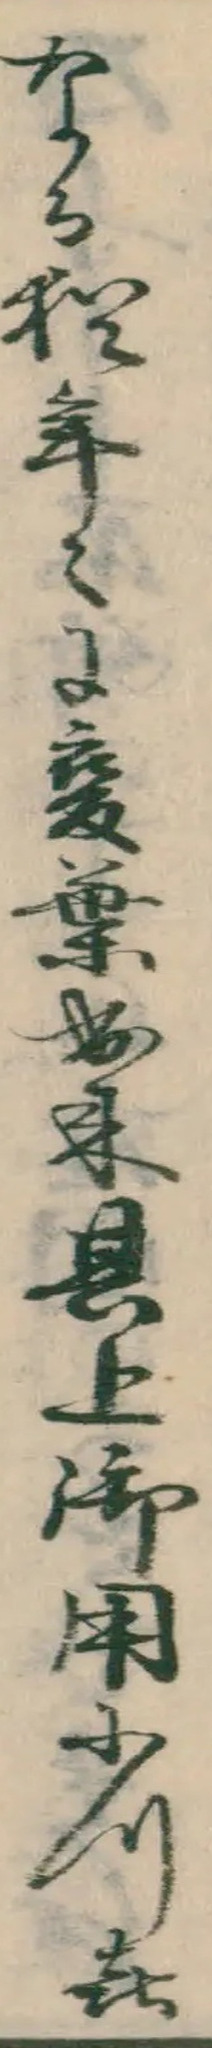なる程年々に変葉出来其上御用につき
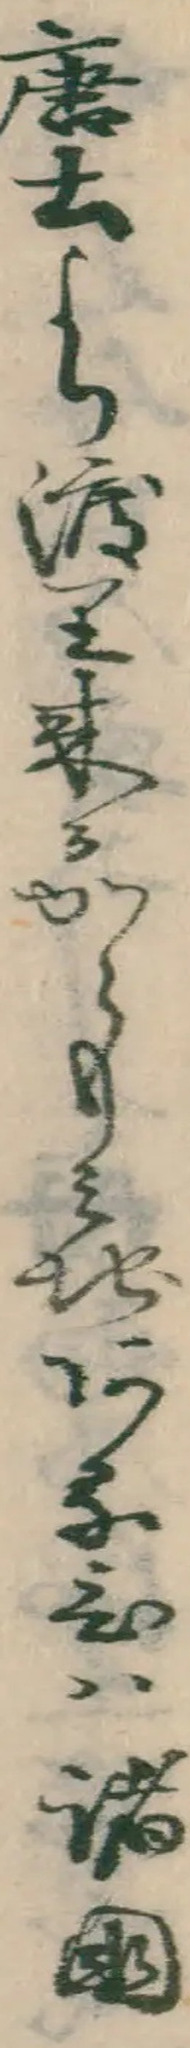唐土より渡り来るからもみちあるひは諸国
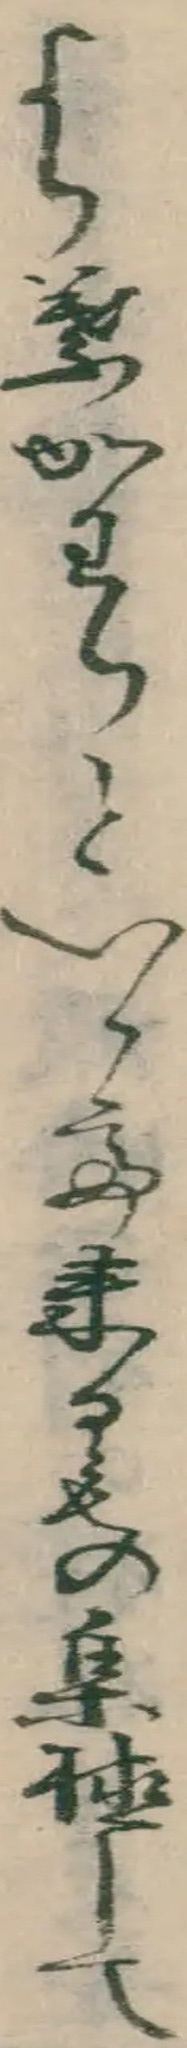より葉かわりといゝて来るもの集植して
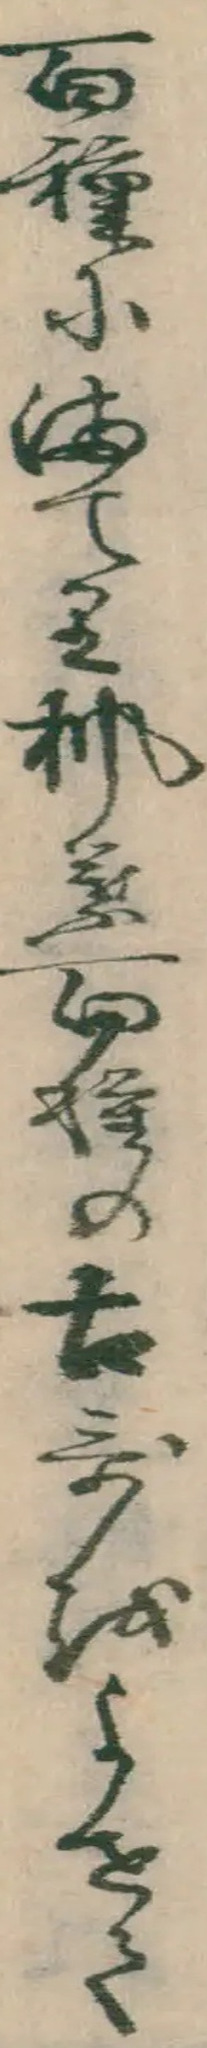百種に滿てり楓葉百種の古哥をよせて
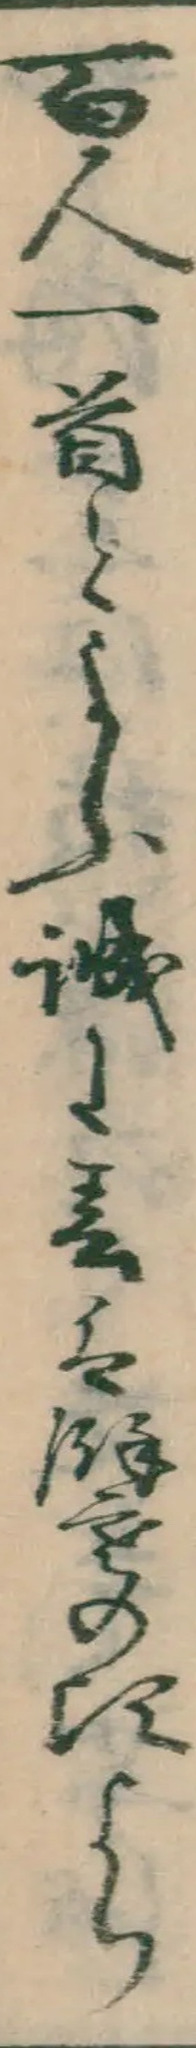百人一首とよふ誠に春は餘寒の頃より

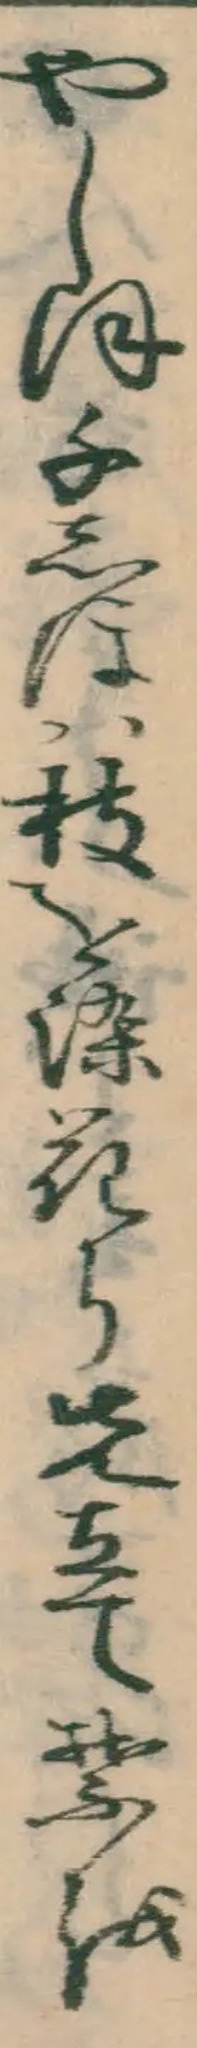やしほちしほは枝を染花に先立て葉を
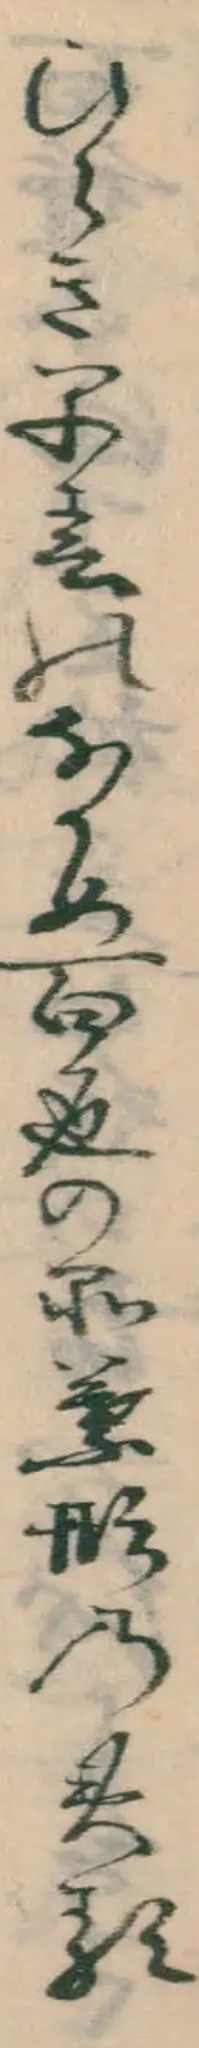ひらき早春のなかめ百色の品葉形の異類
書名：紅葉集
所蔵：国立国会図書館 National Diet Library, JAPAN
